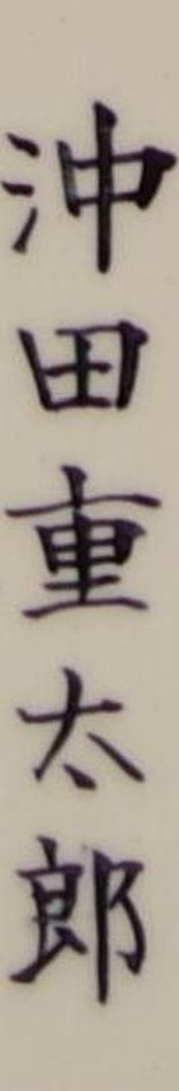神田重太郎
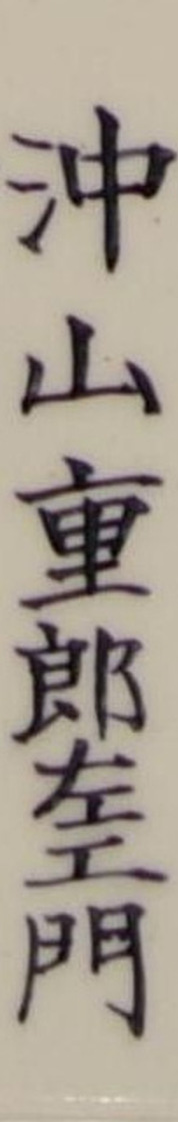沖山重郎左エ門
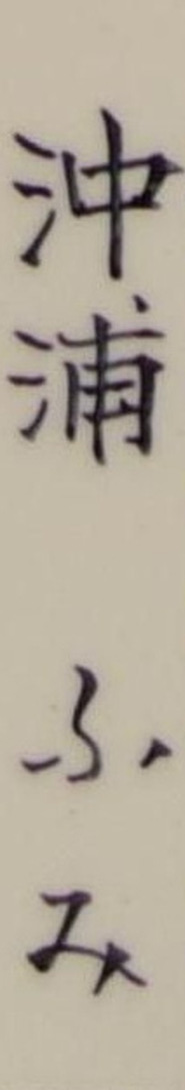沖浦ふみ
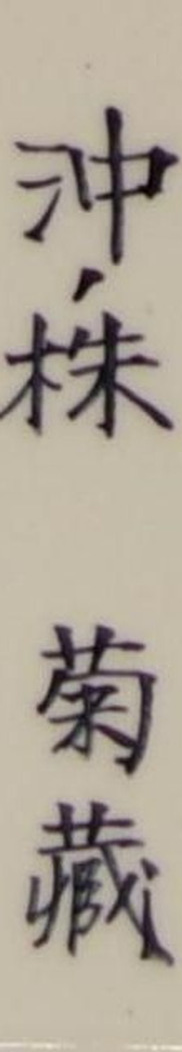沖ノ株菊蔵
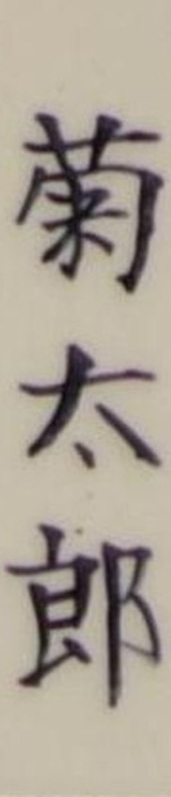菊太郎

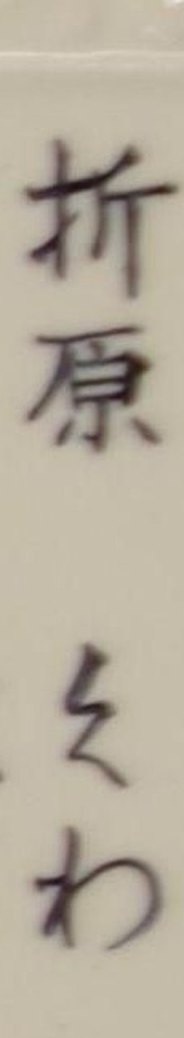折原くわ
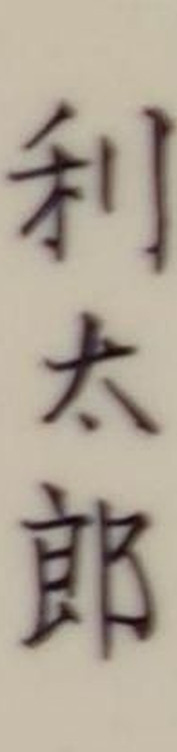利太郎
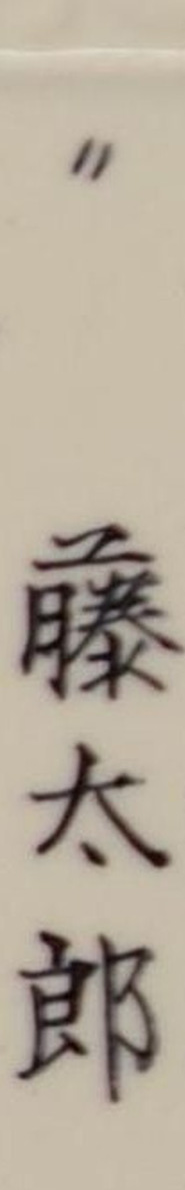藤太郎
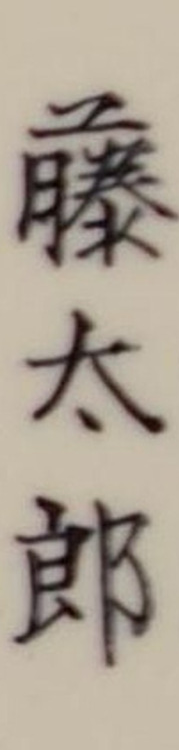藤太郎
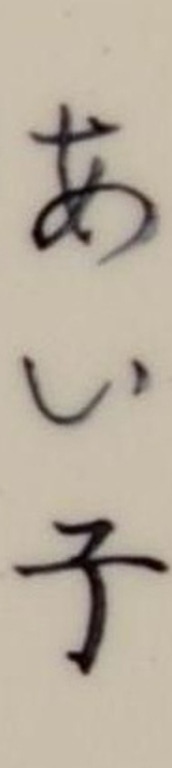あい子
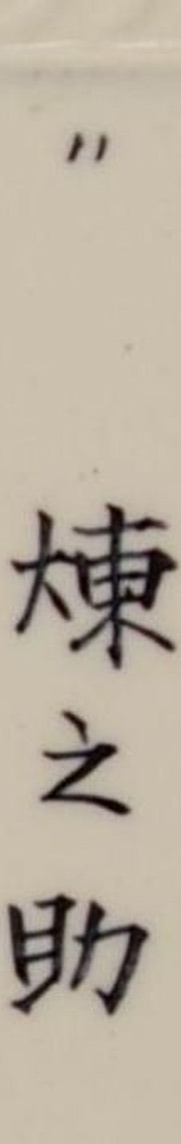煉之助
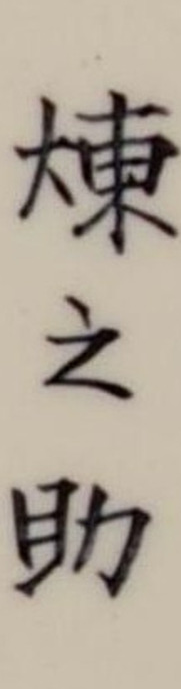煉之助
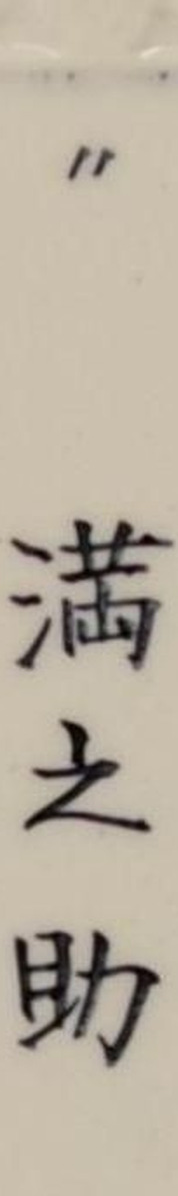煉之助
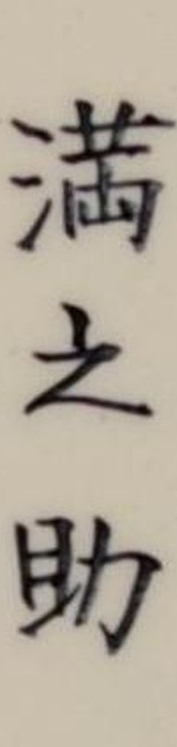煉之助
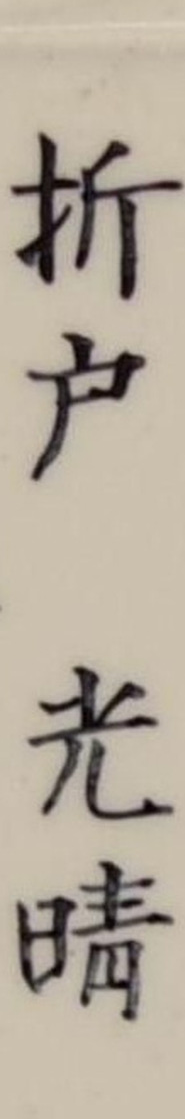折戸光晴
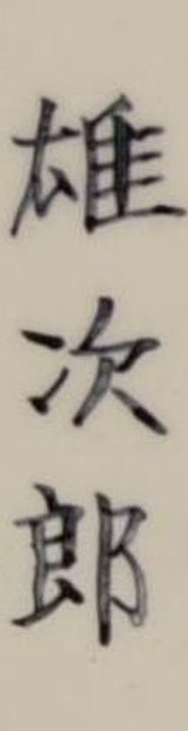雄次郎
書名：E~L
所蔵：高野山金剛峯寺
